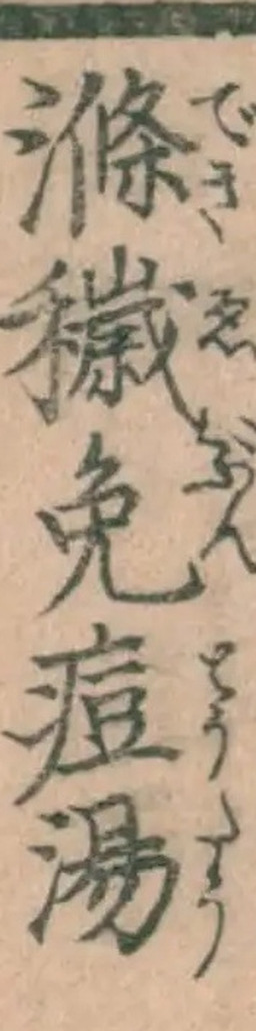滌穢免痘湯

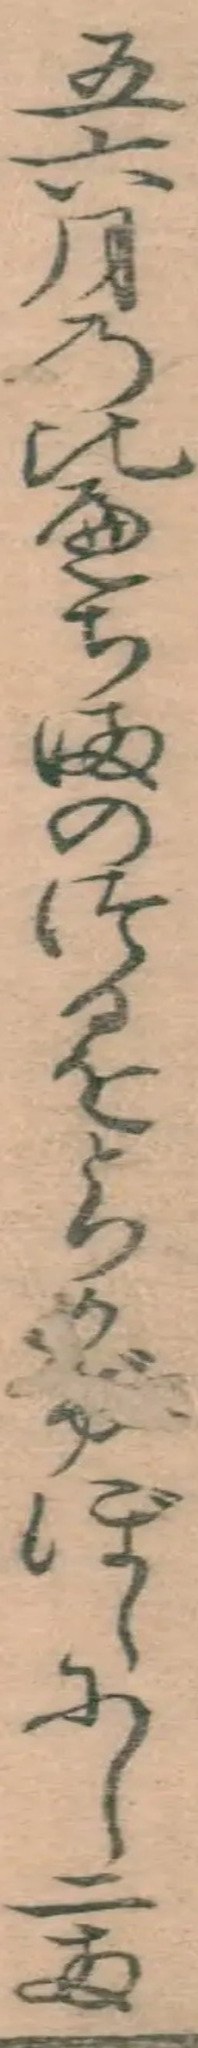五六月の比へちまのつるをとりかげぼしにし二両
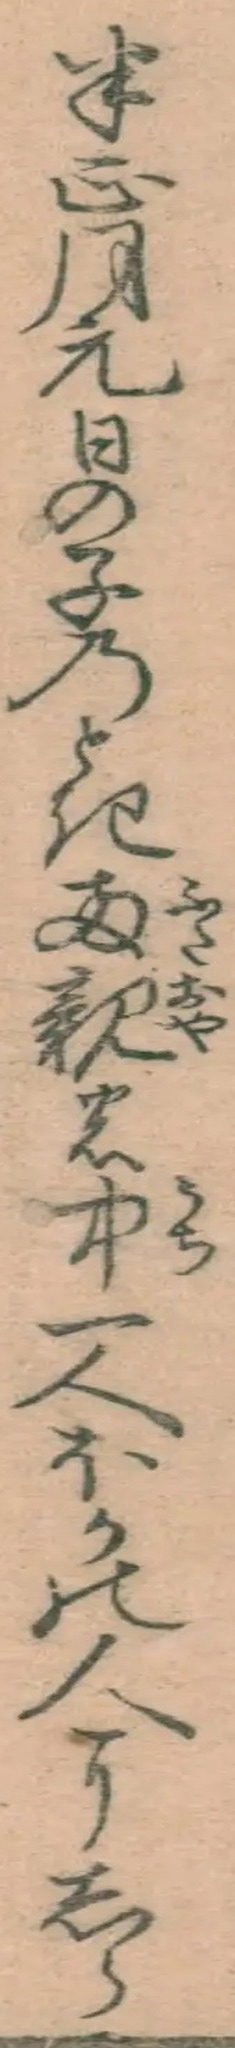半正月元日の子のとき両親の中一人ほかの人にしら
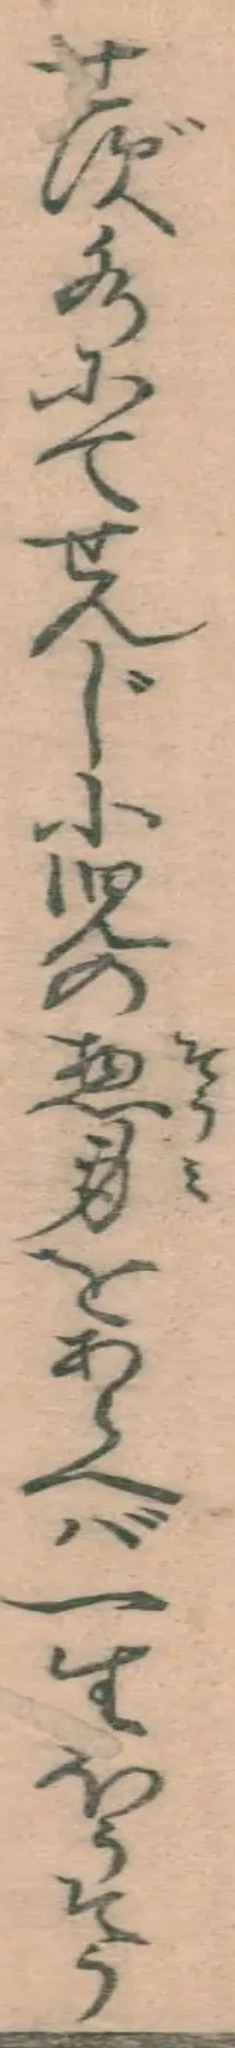せず水にてせんじ小児の惣身をあらへば一生ほうそう
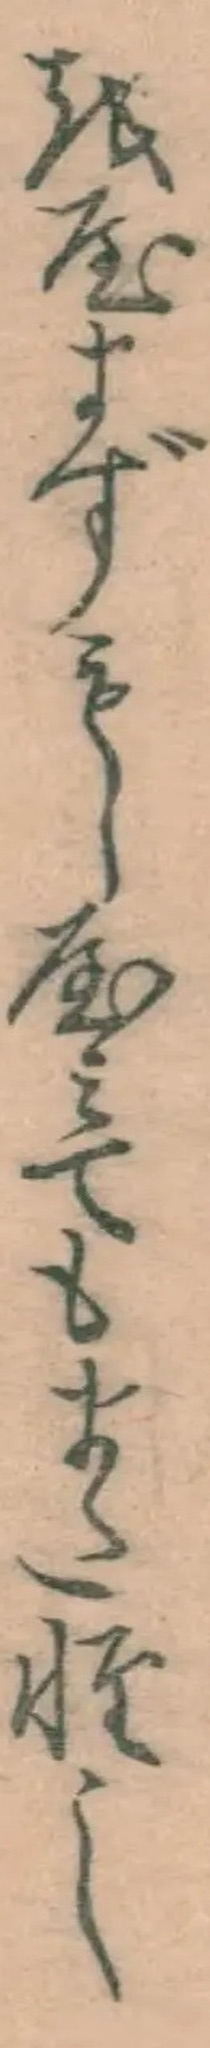をやまずもしやみてもまた軽し
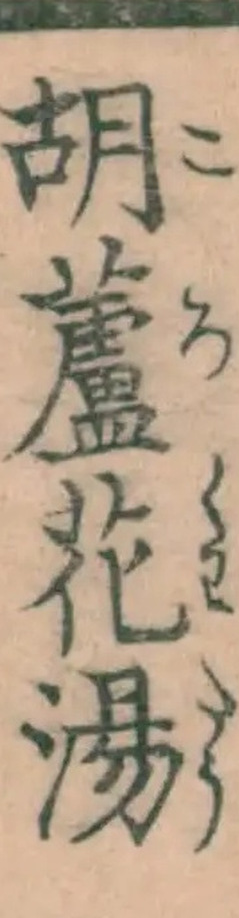胡蘆花湯
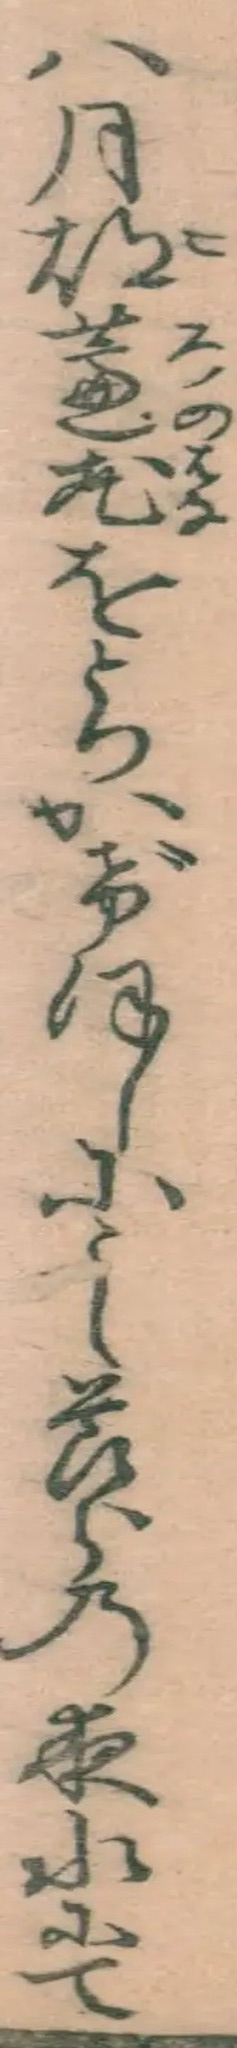八月胡蘆花をとりかげほしにし節分の夜水にて
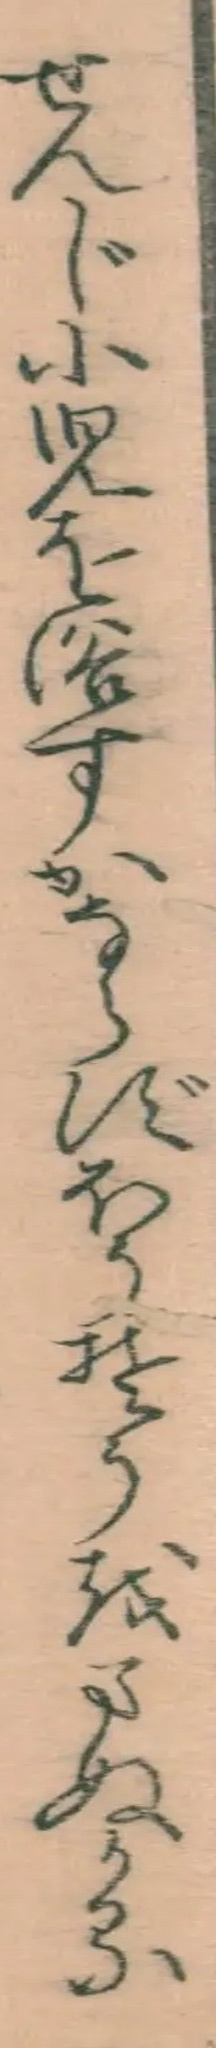せんじ小児を浴すかならずほうそうをまぬかる
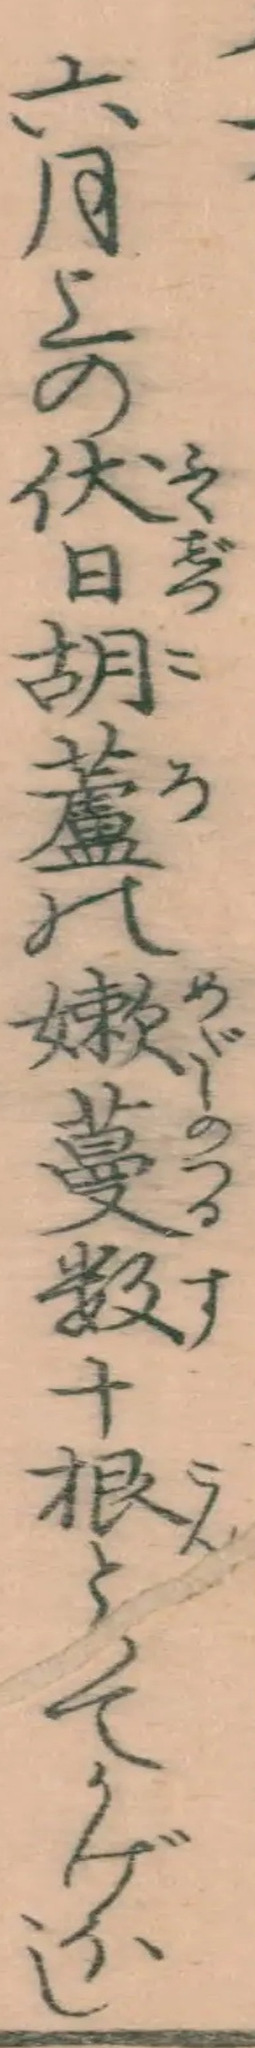六月上の伏日胡蘆の嫩蔓数十根とりてかげほし
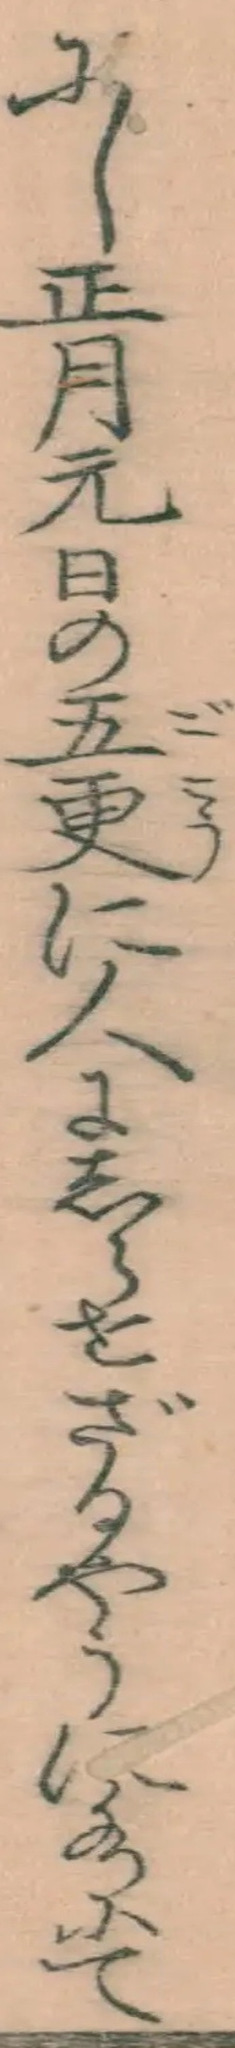にし正月元日の五更に人にしらせざるやうに水にて
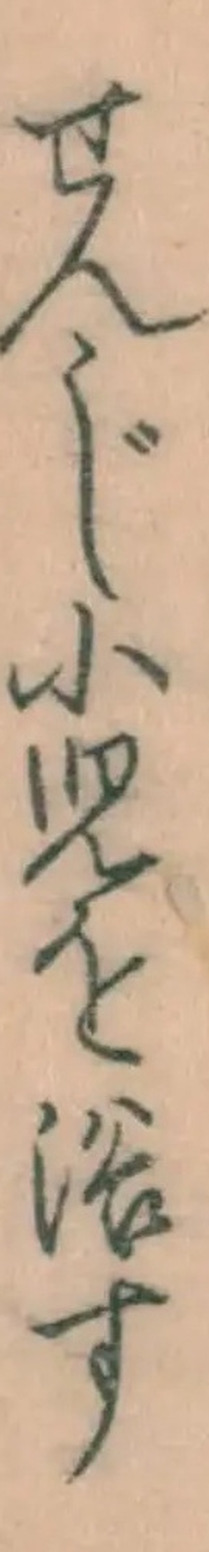せんじ小児を浴す
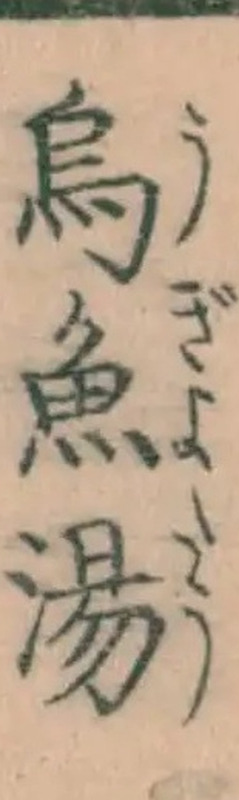烏魚湯

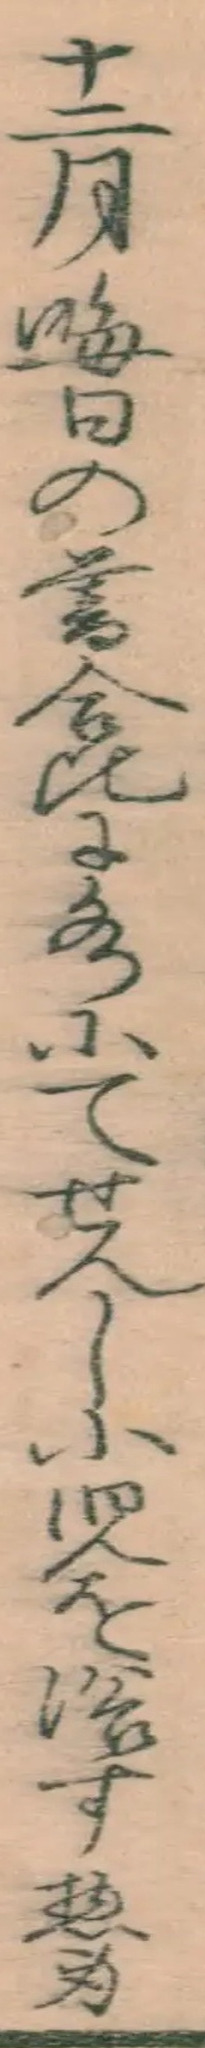十二月晦日の暮合比に水にてせんし小児を浴す惣身
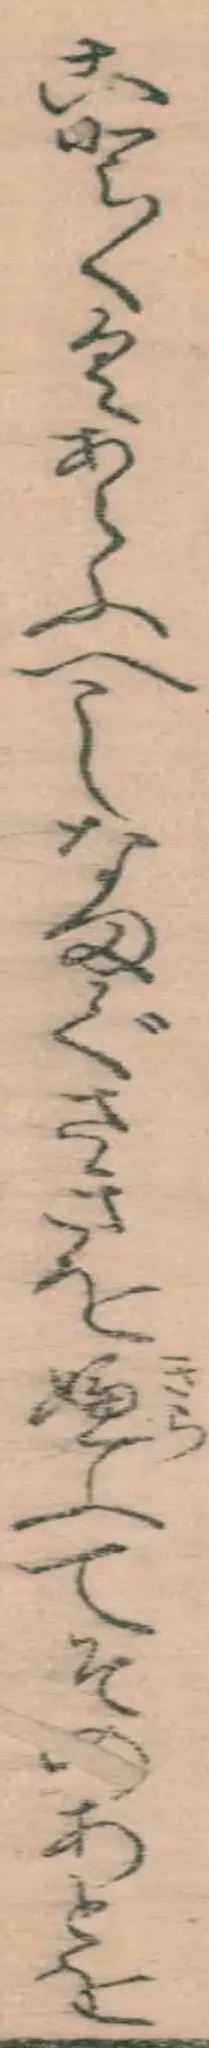ことくるみあらふへしなまぐささを嫌ふてそのあとを
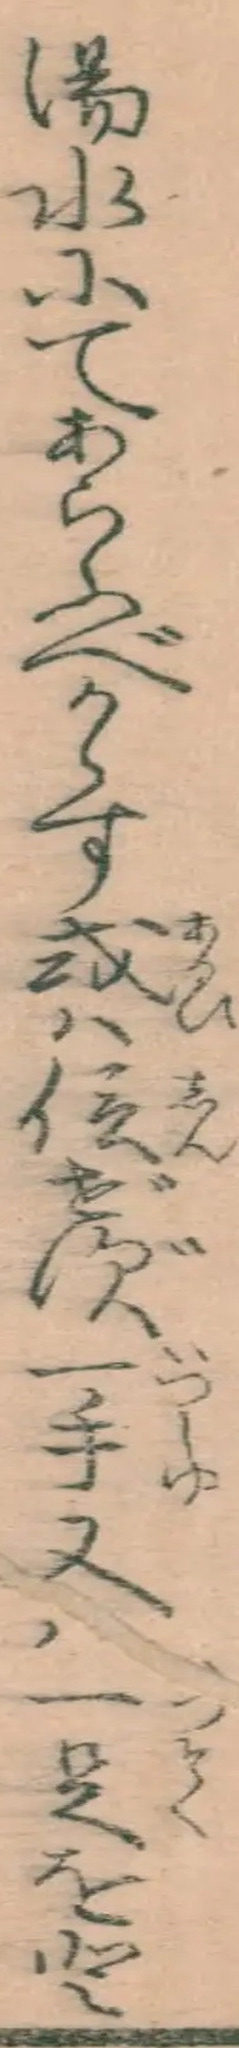湯水にてあらふべからす或は信ぜず一手又は一足をと
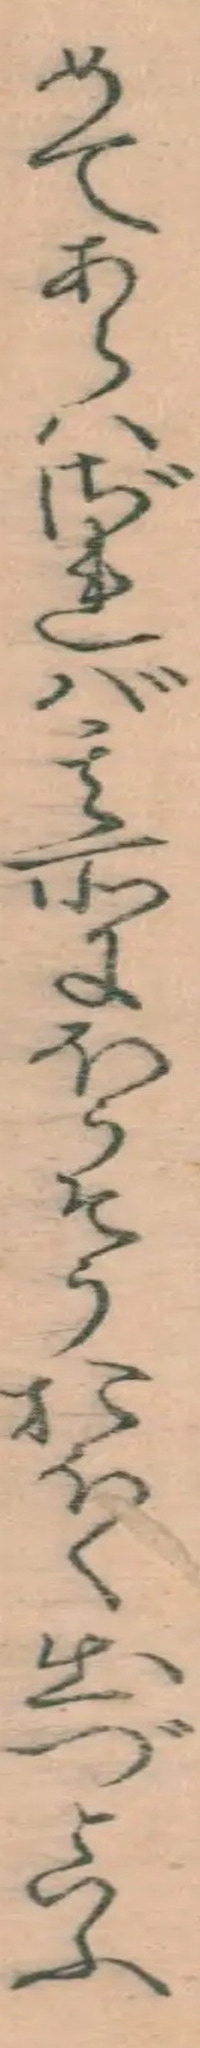めてあらはざれば其所にほうそうおほく出づといふ
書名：雨夜談
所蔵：国立国会図書館 National Diet Library, JAPAN
